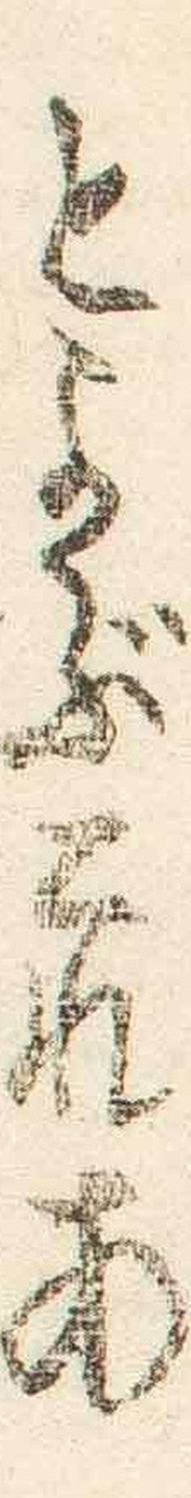とよぶこれあ
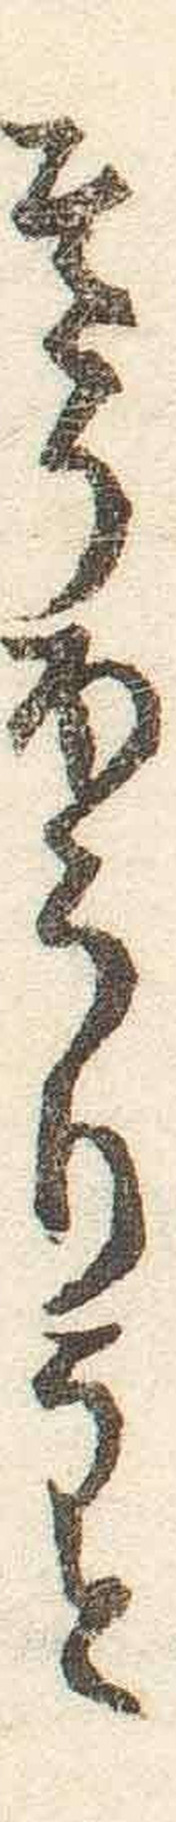そうほうりうと
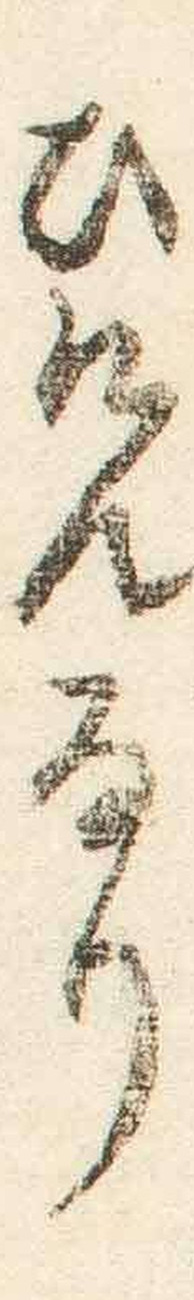ひけんなり
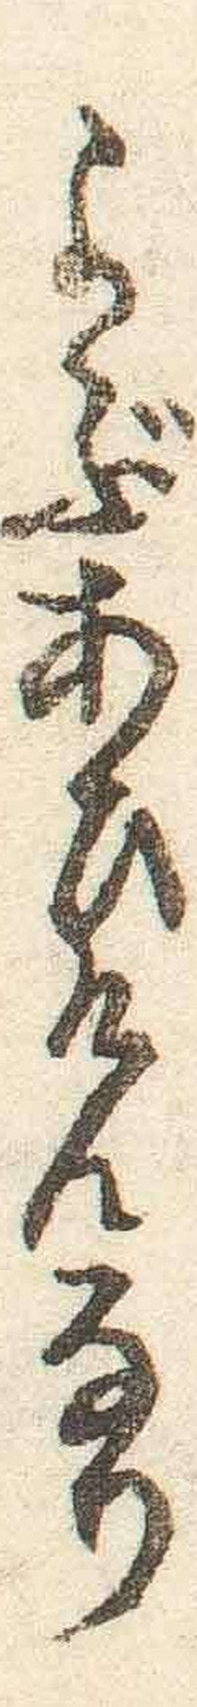よぶあひけんなり

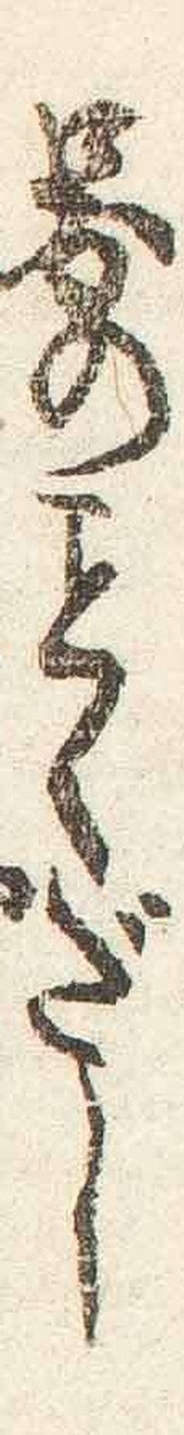図のことくだし
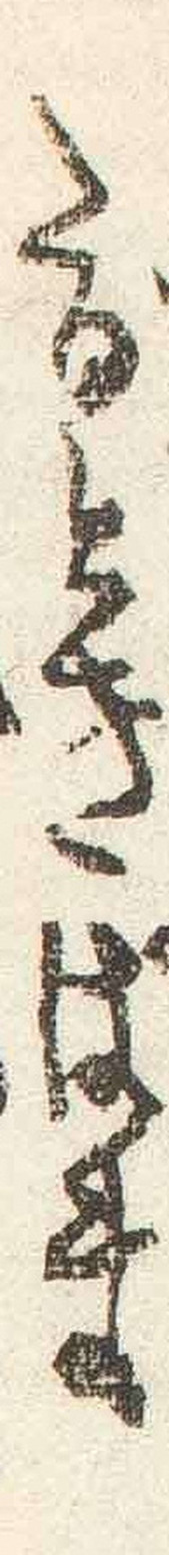たるときぱま
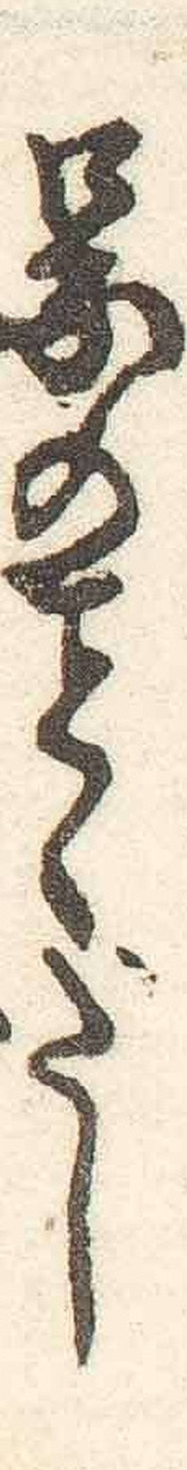図のことくだし
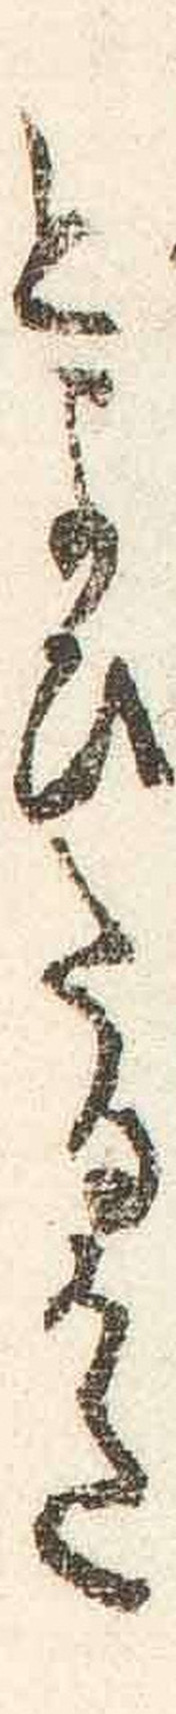とよひたるかた
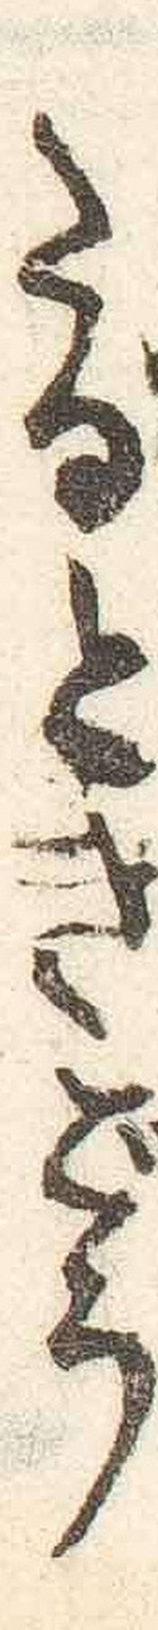たるときごう
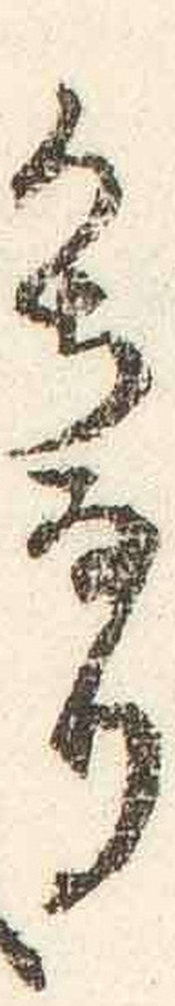かちなり
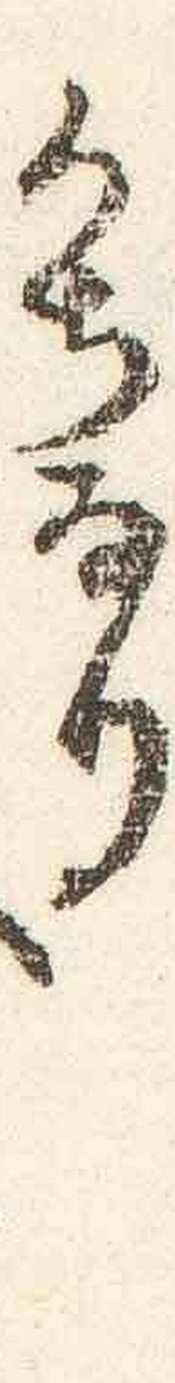かちなり
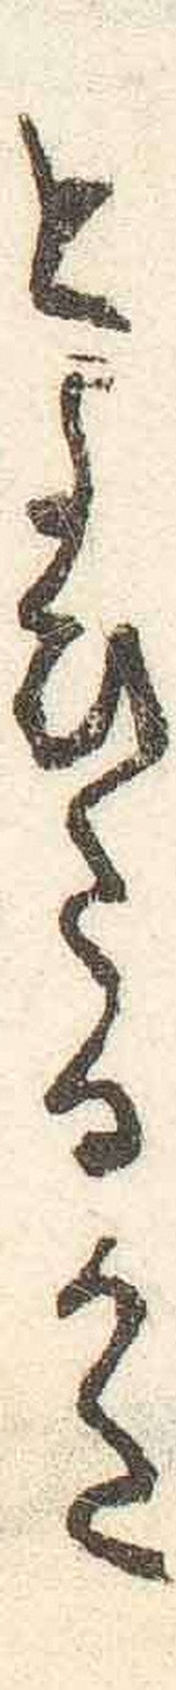とよひたるかた
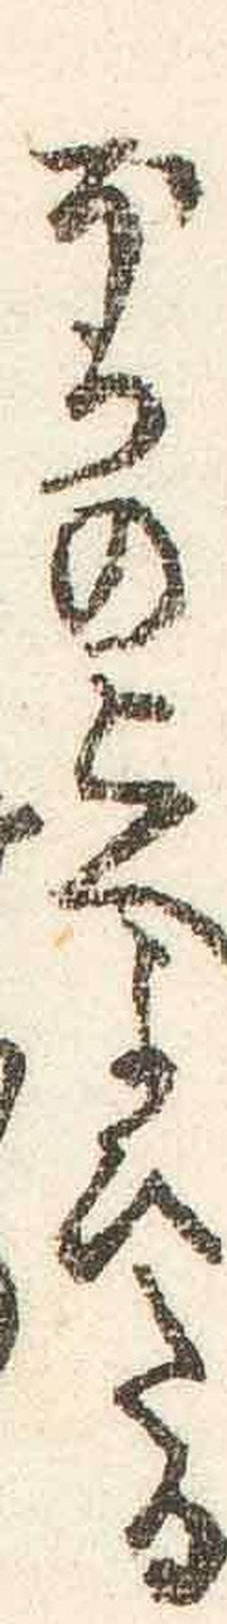ほかのこへよひたる
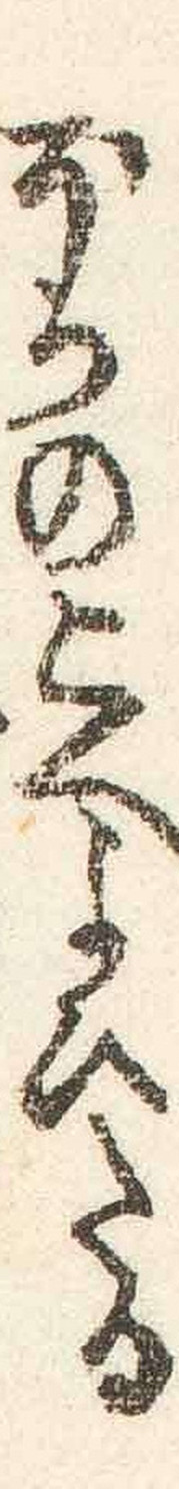ほかのこへよひたる
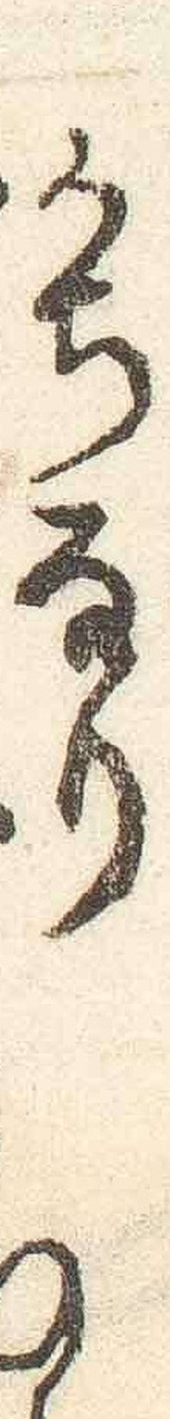かちなり
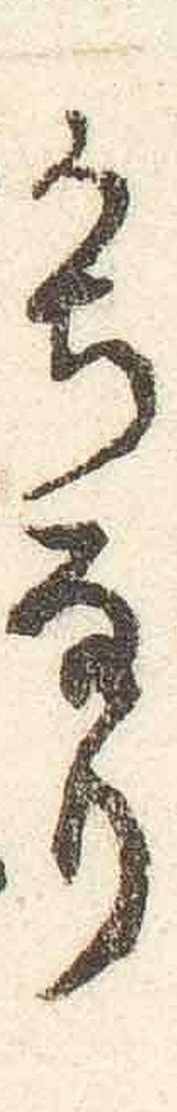かちなり
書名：拳独稽古
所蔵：東京学芸大学附属図書館 国文学研究資料館
